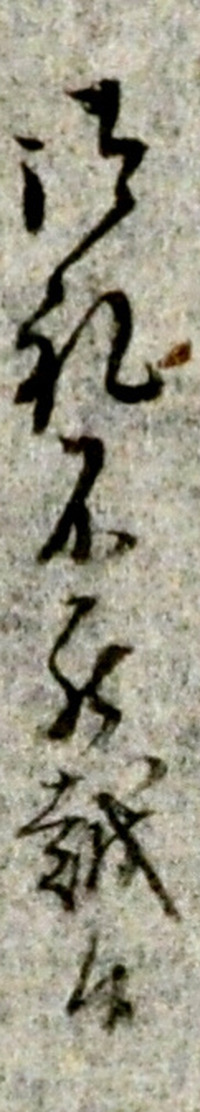御礼不罷越候
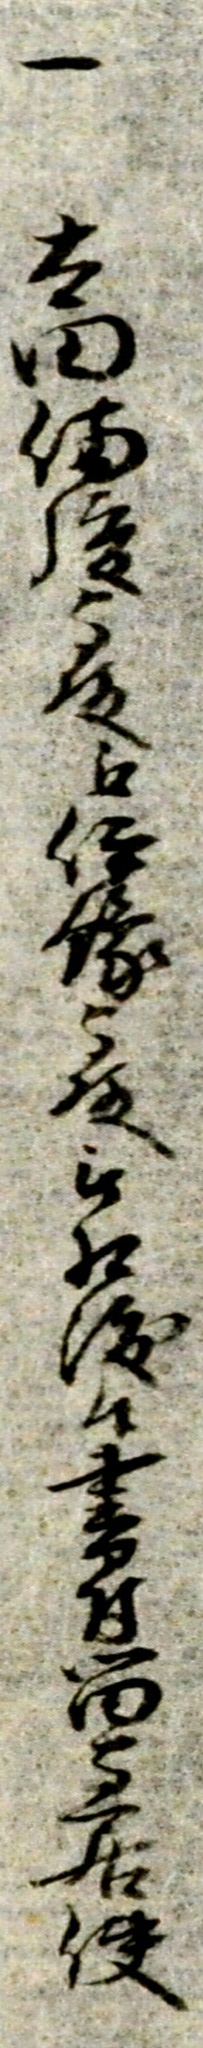一太田備後守殿江伊豫守殿江相渡候書付留守居使
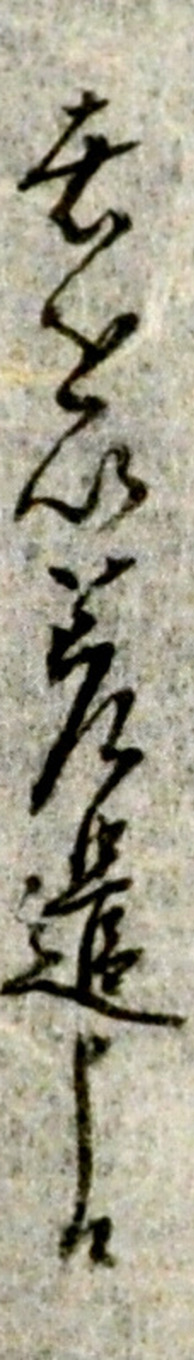者を以差遣申候

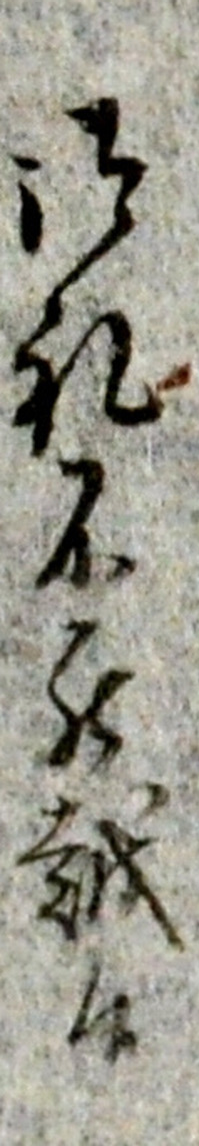御礼不罷越候
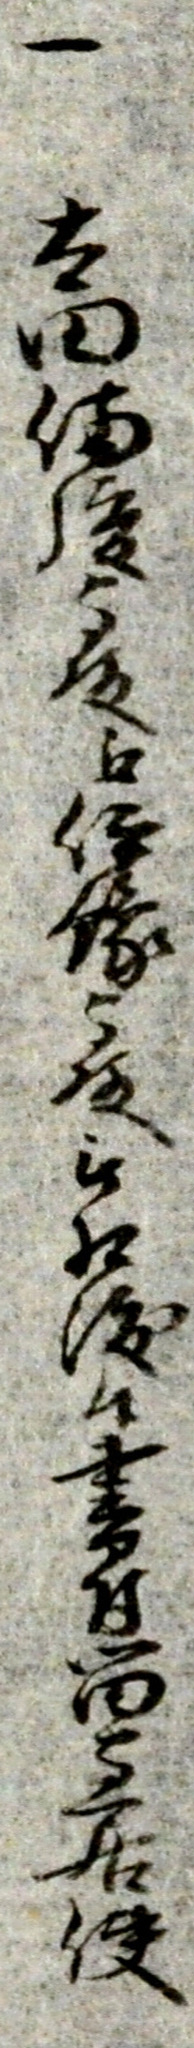一太田備後守殿江伊予守殿被相渡候書付留守居使
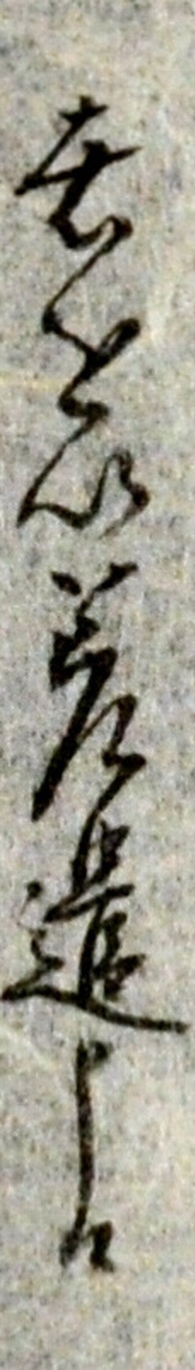者を以差遣申候
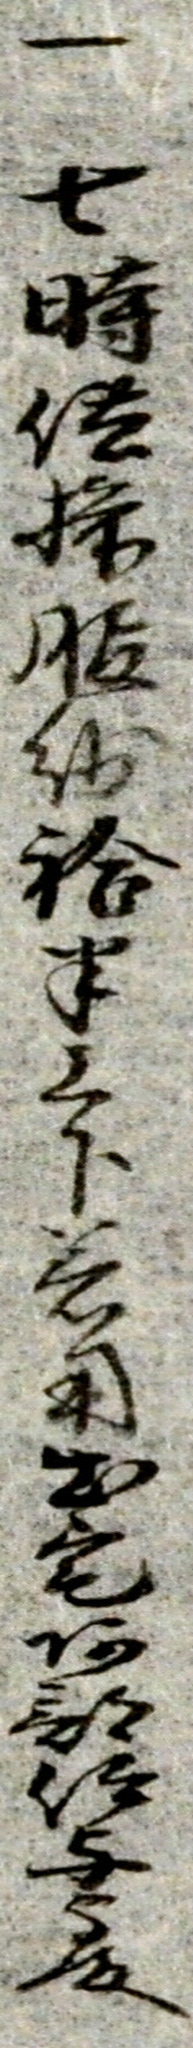一七時供揃服紗袷半上下着用出宅阿部伊与守殿
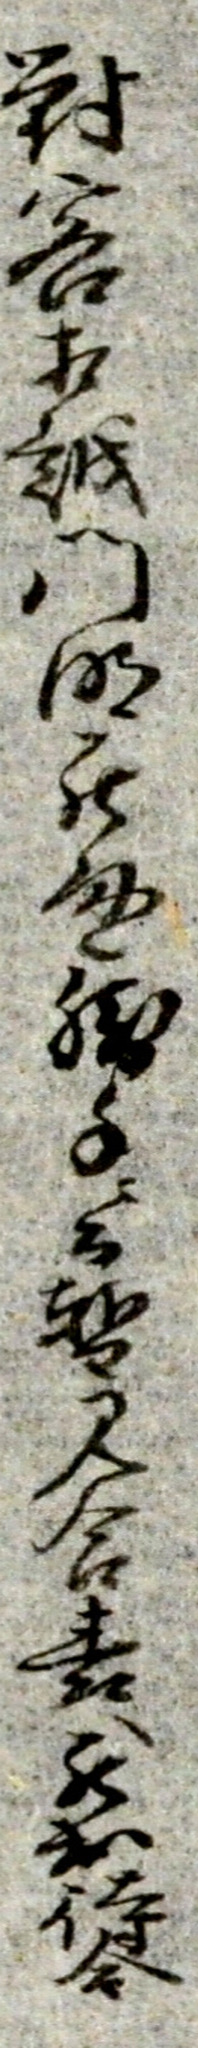対客相越門明罷帰勝手ニ而暫見食表へ罷出待合
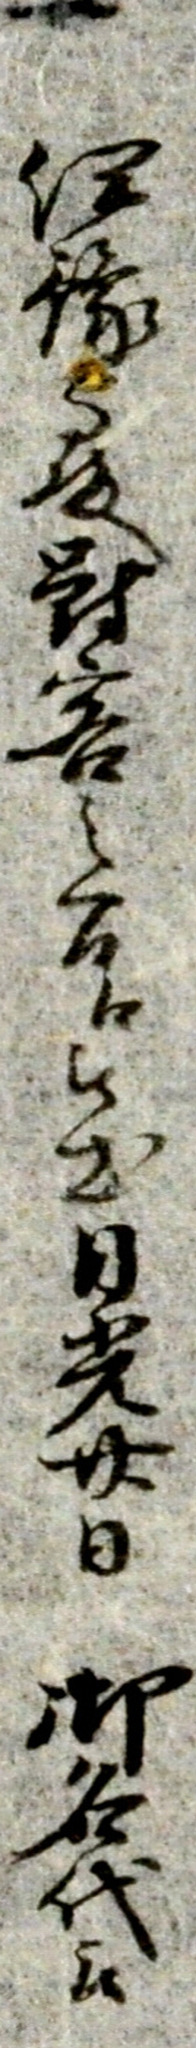一伊予守殿対客之間江被出日光廿日御名代被
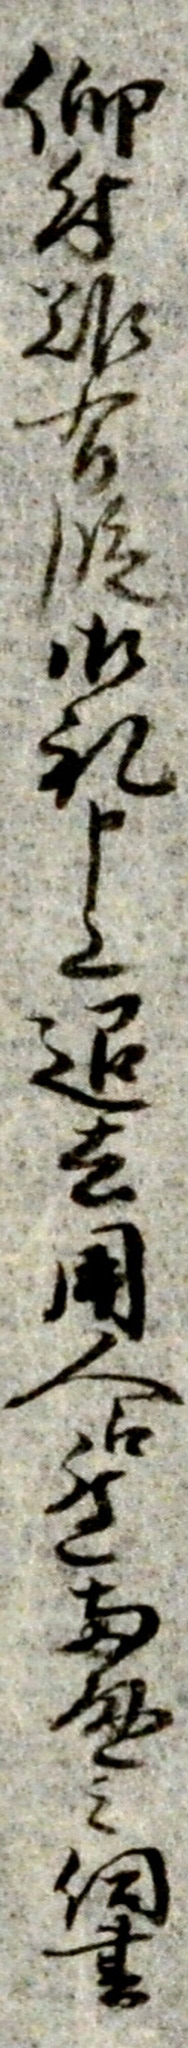仰付難有段御礼申上退去用人江達両通之伺書
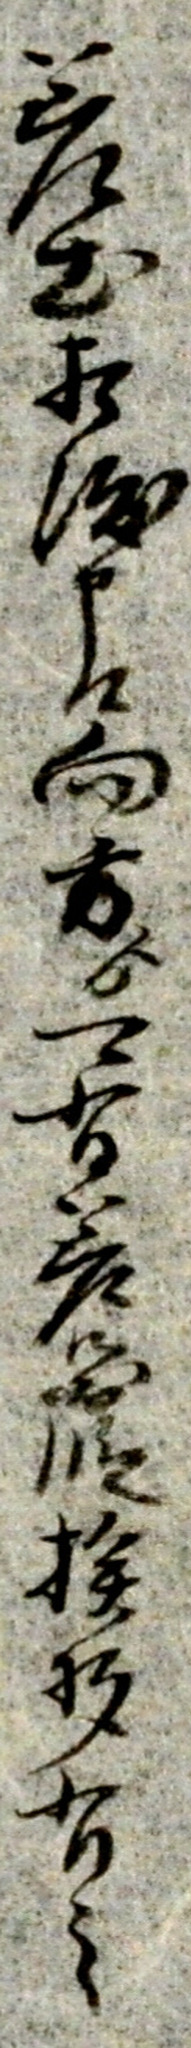差出相渡申候向方ゟ可有差図段挨拶有之
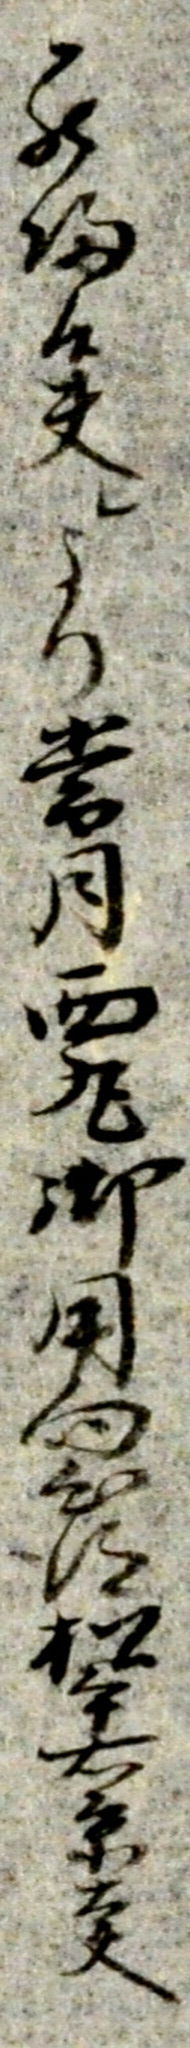罷帰候夫レより当月西丸御用向心得松平右京大夫
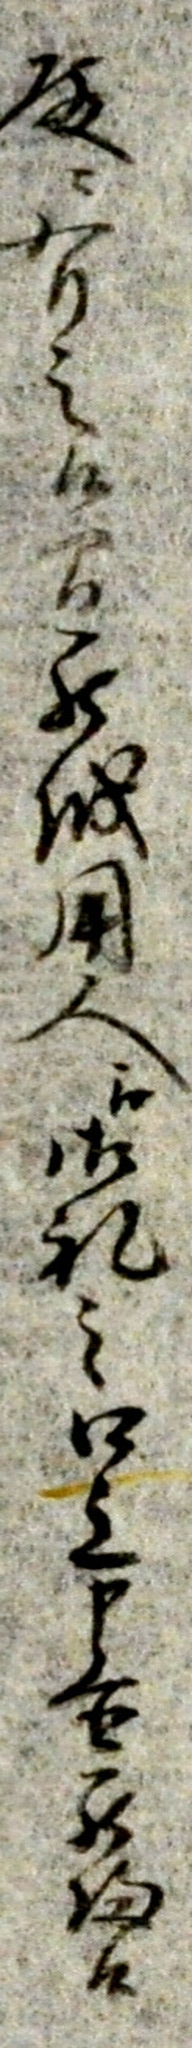殿ニ有之候間罷越用人江御礼之口上申置罷帰候

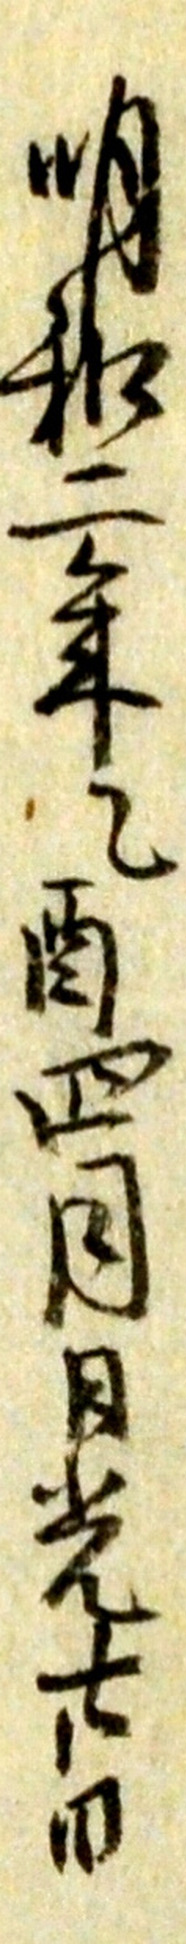明和二年乙酉四月日光廿日
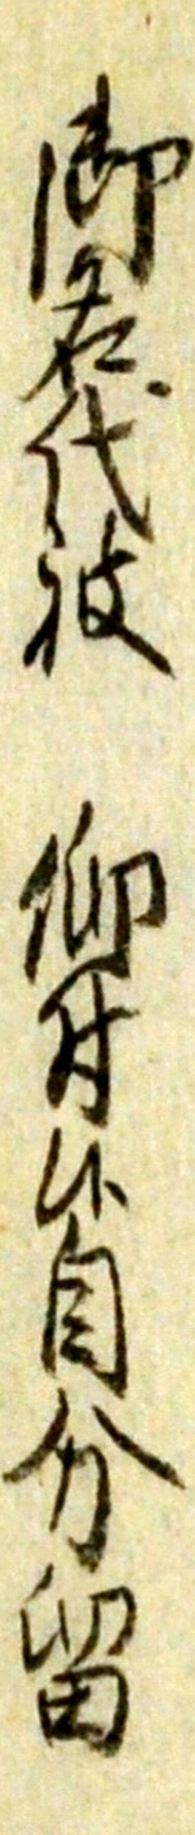御名代被仰付候自分留
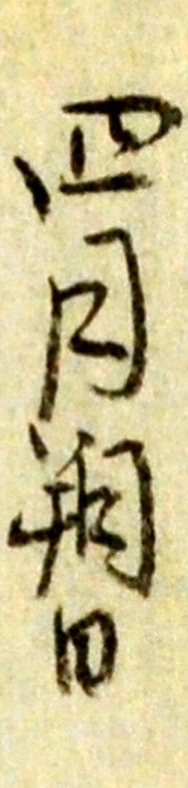四月朔日
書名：日光御名代相勤候節ノ留
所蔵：伊那市立高遠町図書館・合同会社AMANE
